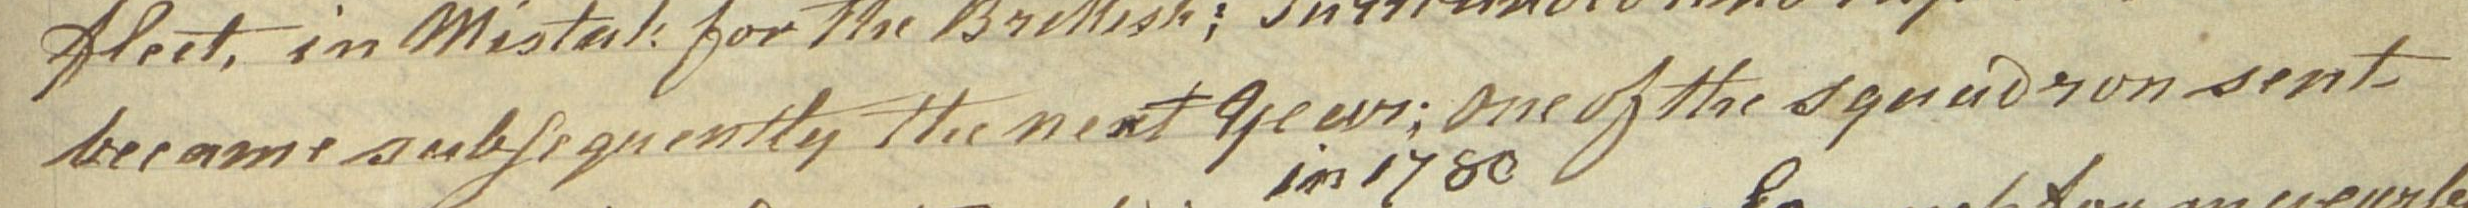became subsequently the next year; one of the squadron sent
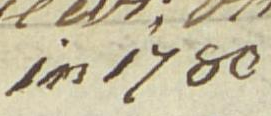in 1780
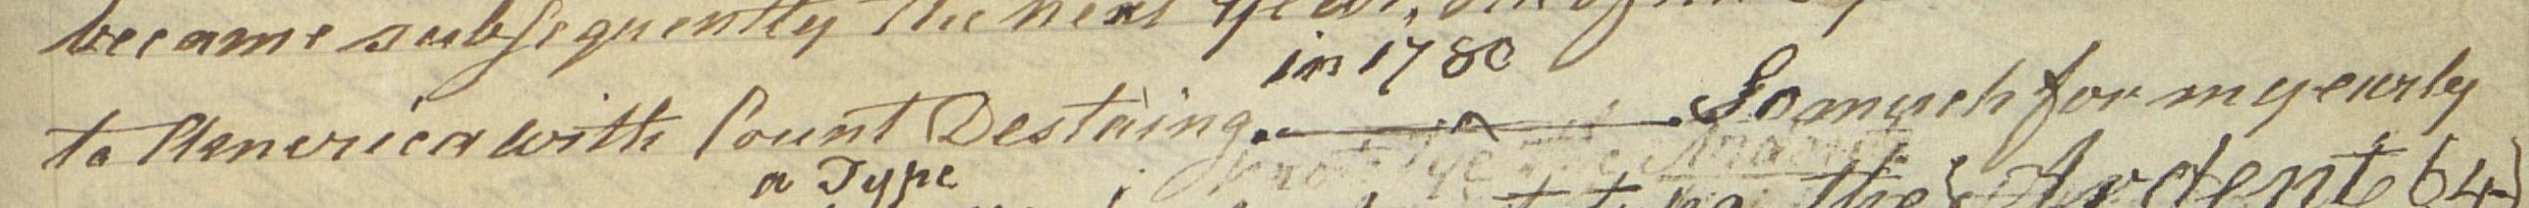to America with Count Destaing. ^ So much for my early
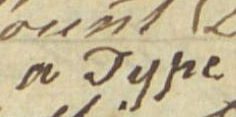a Type
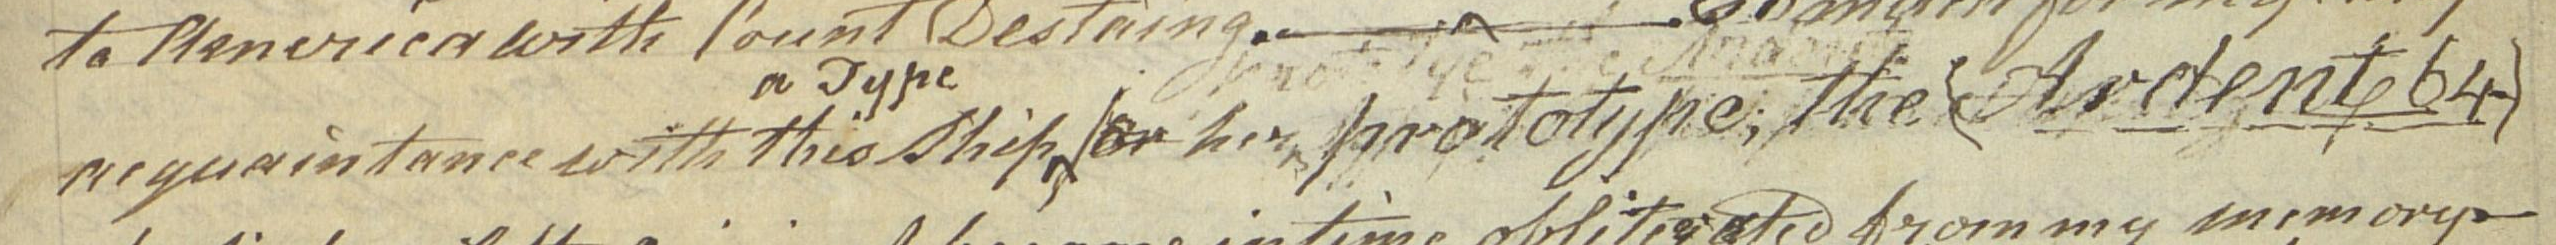acquaintance with this ship ^ for her prototype.; the (Ardent 64)
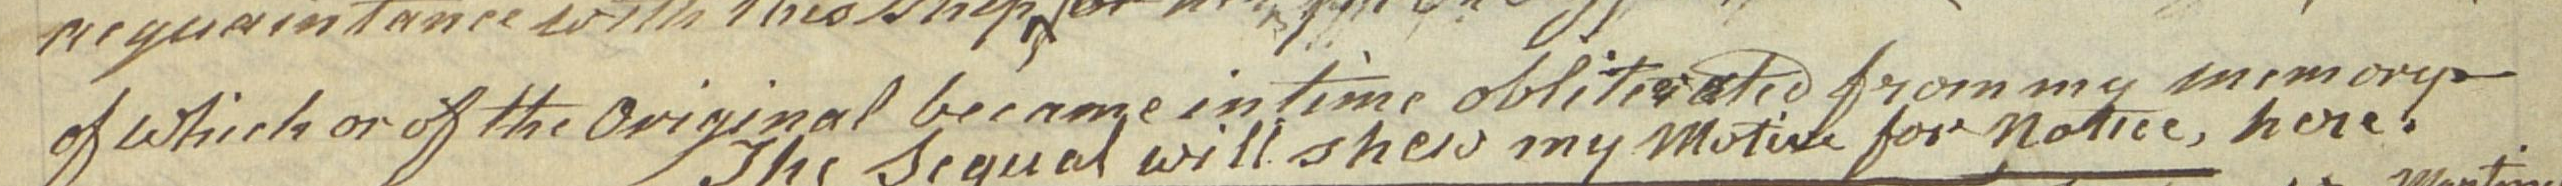of which or of the Original became in time obliterated from my memory,
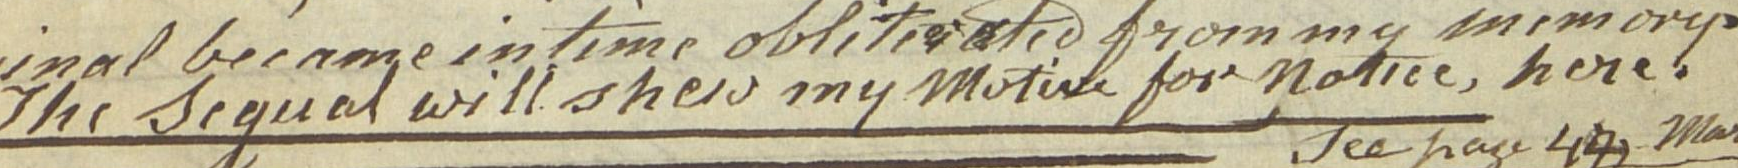The Scqual will shew my motive for notice here.
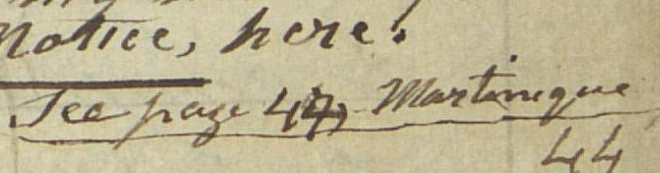See page 44 Martinique
